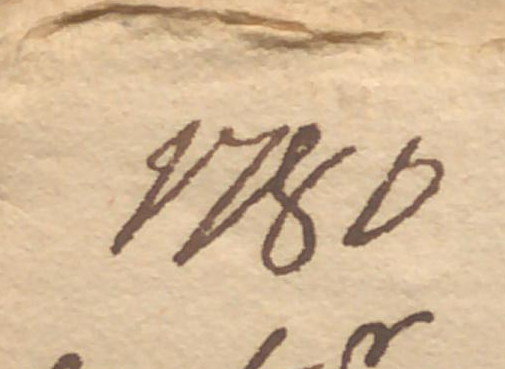1780
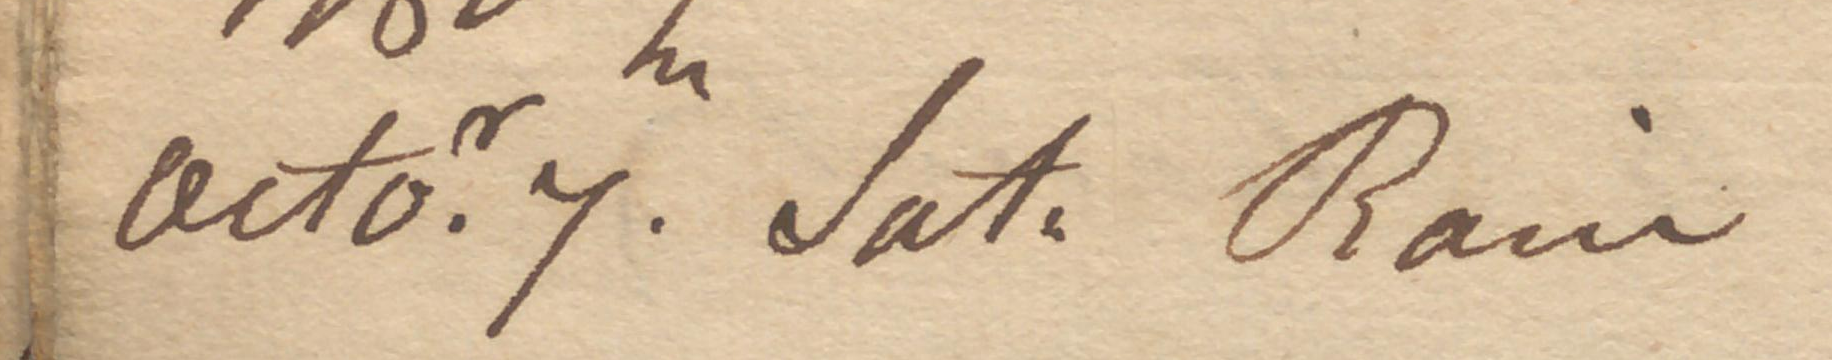Octo^r. 7^th. Sat. Rain
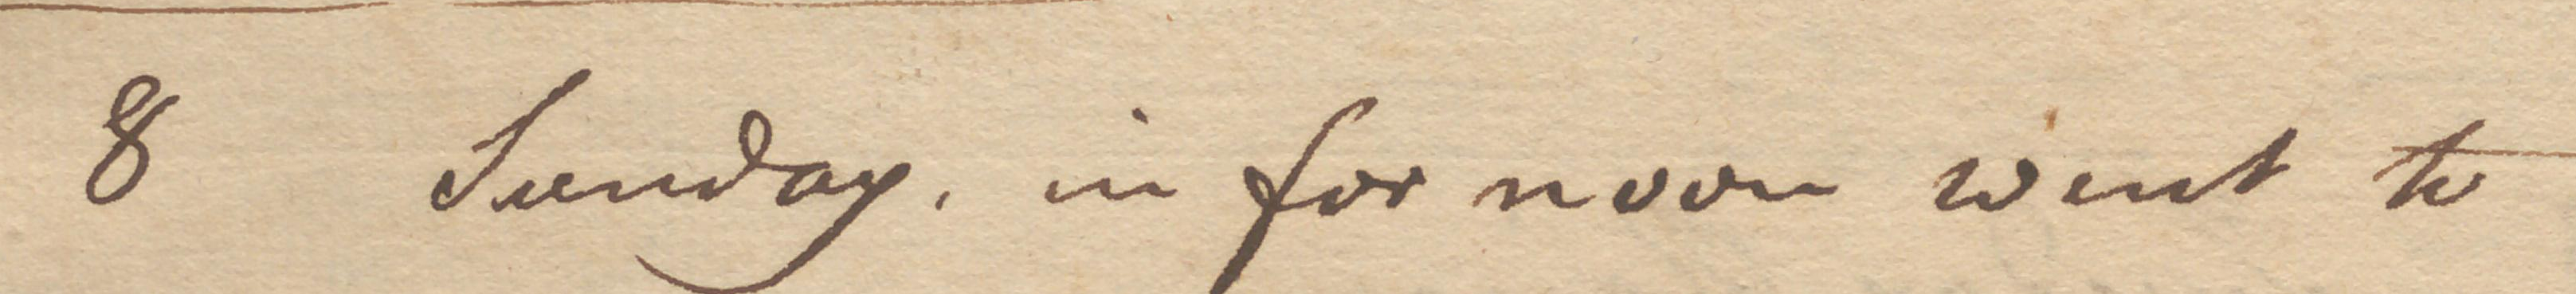8 Sunday, in for noon went to
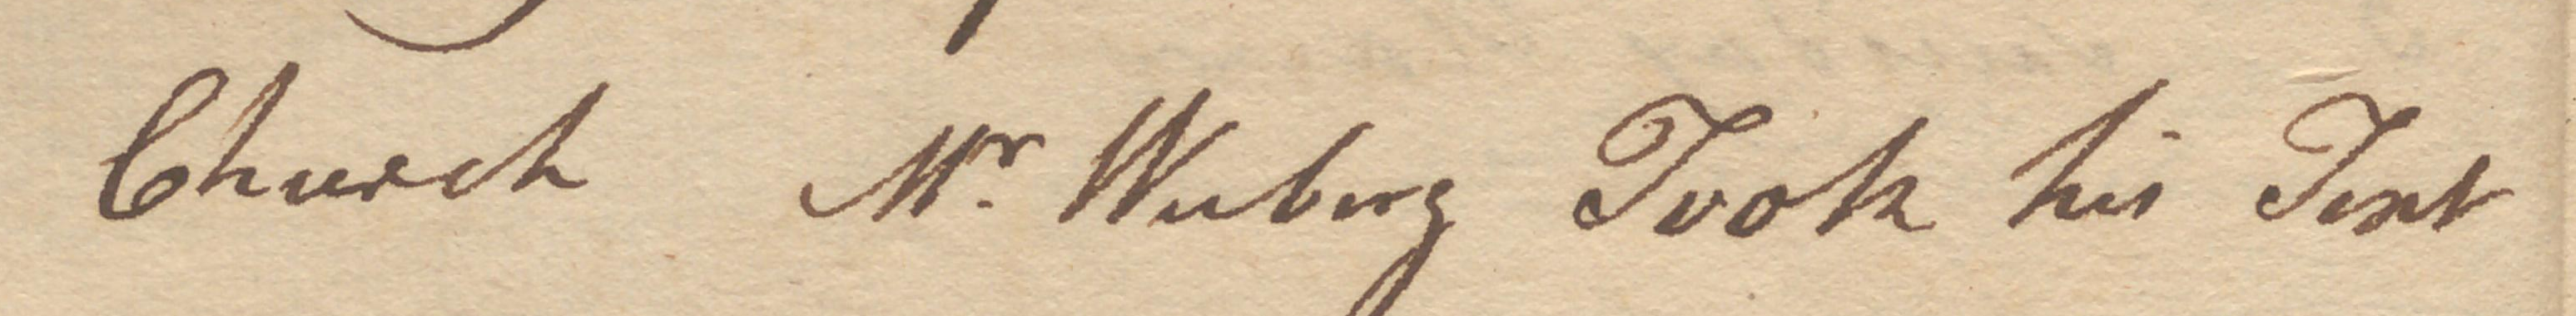Church M^r. Wuberg Took his Text
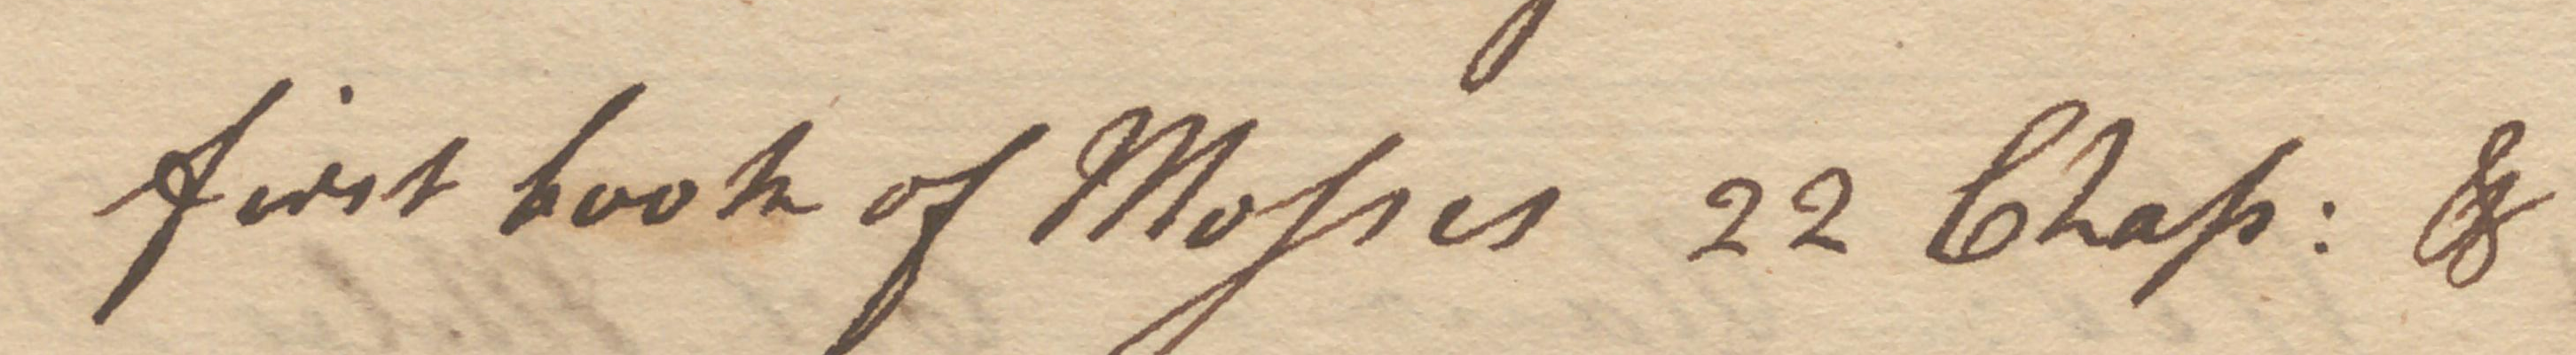first book of Mosses 22 Chap: &
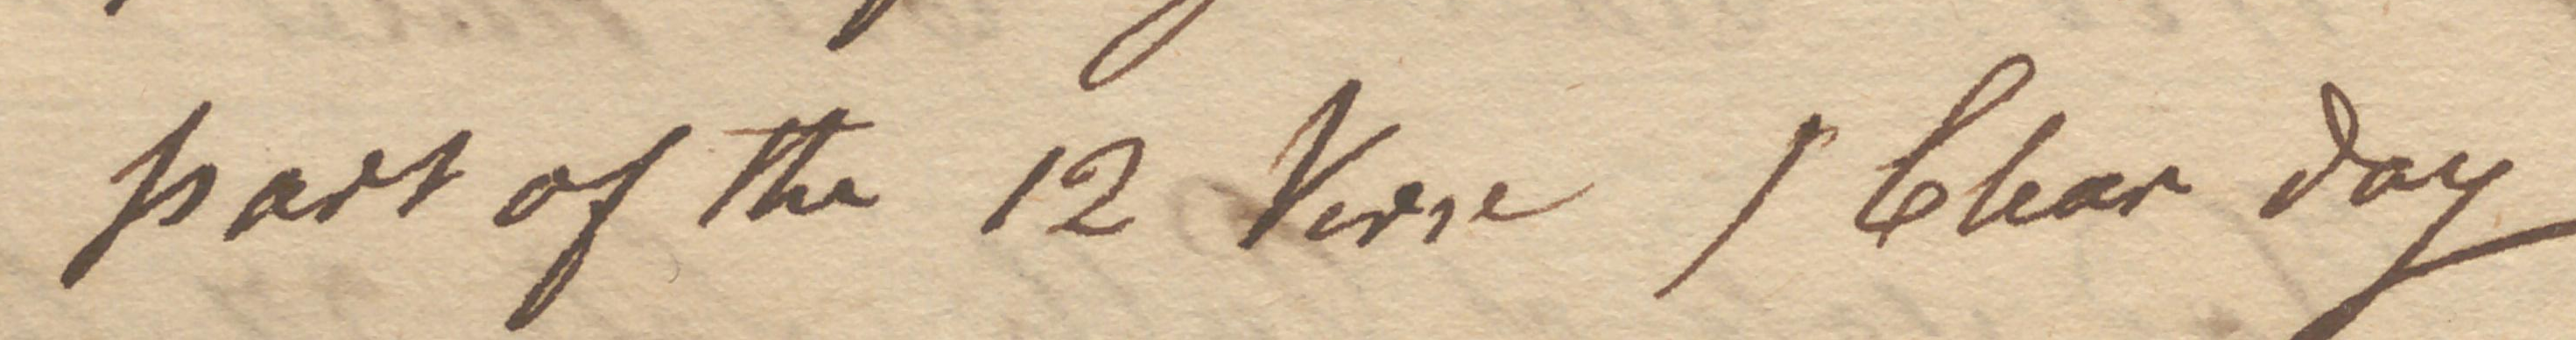part of the 12 Verse J Clear day
